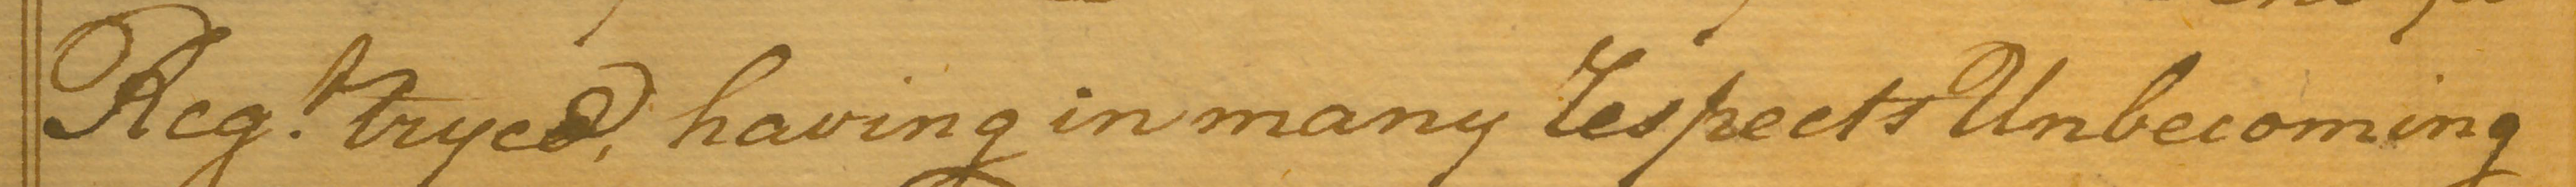Reg^t. tryed, having in many respects Unbecoming
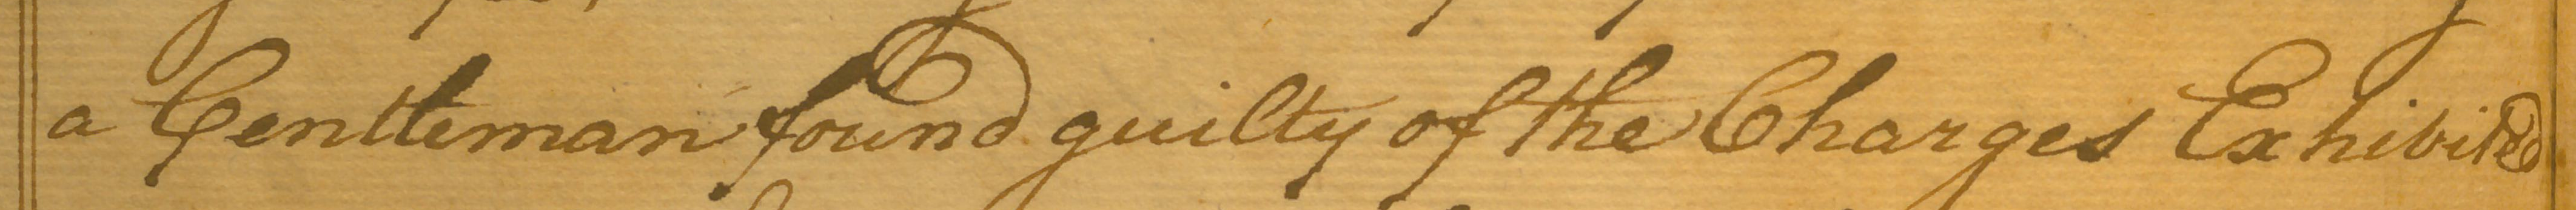a Gentleman found guilty of the Charges Exhibited
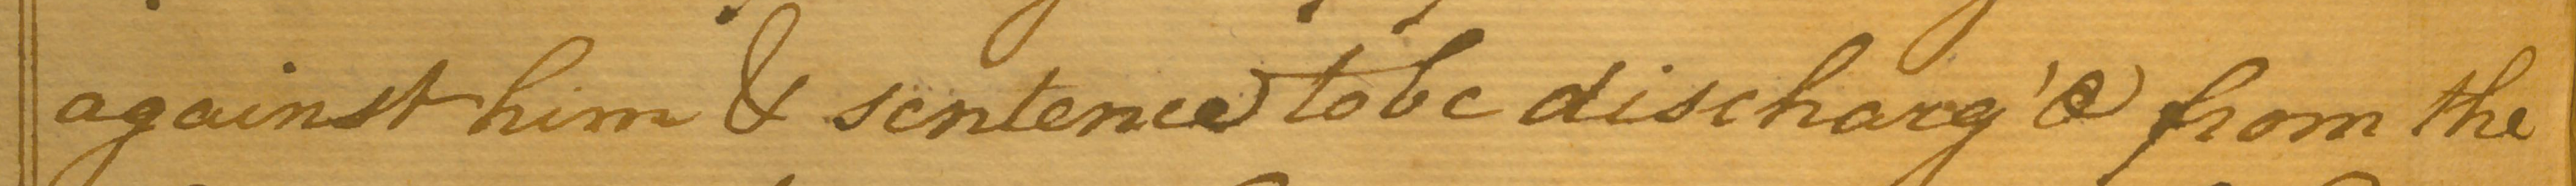against him & sentenced to be discharg'd from the
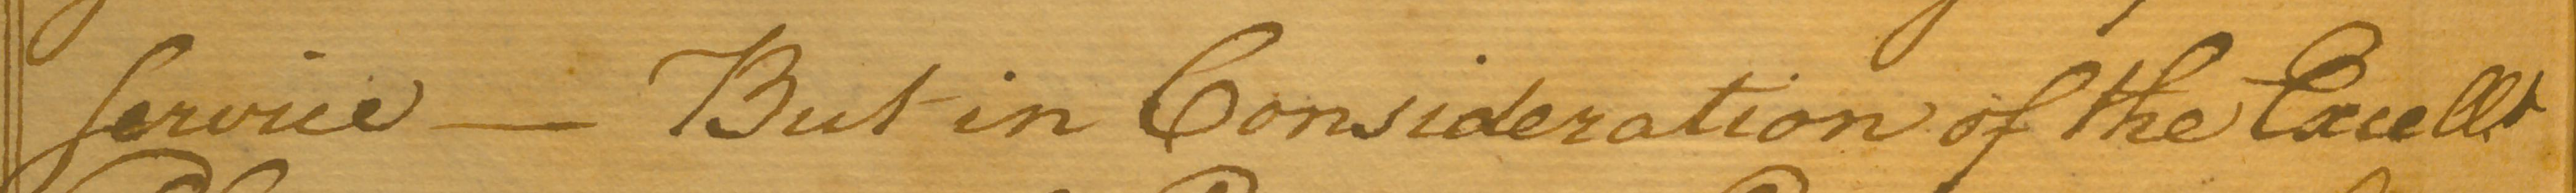service- But in Consideration of the Excell^t.
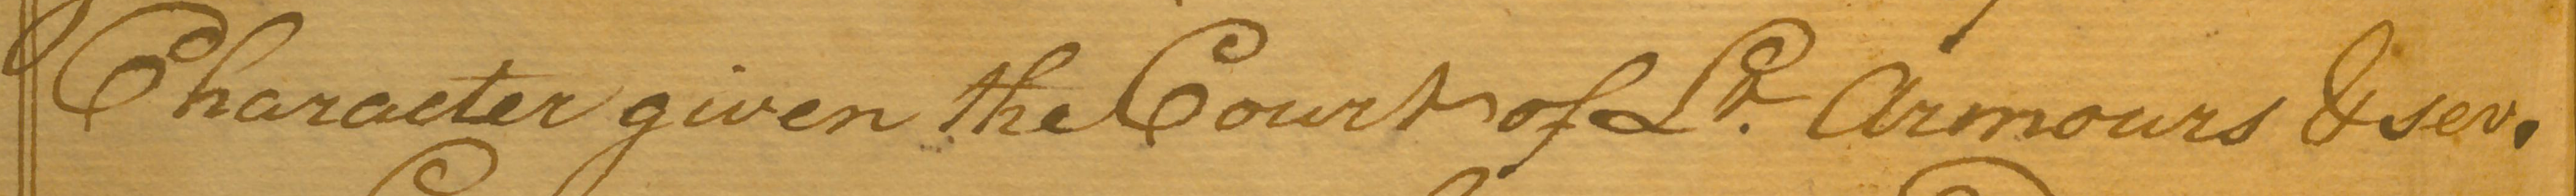Character given the Court of L^t. Armours & sev
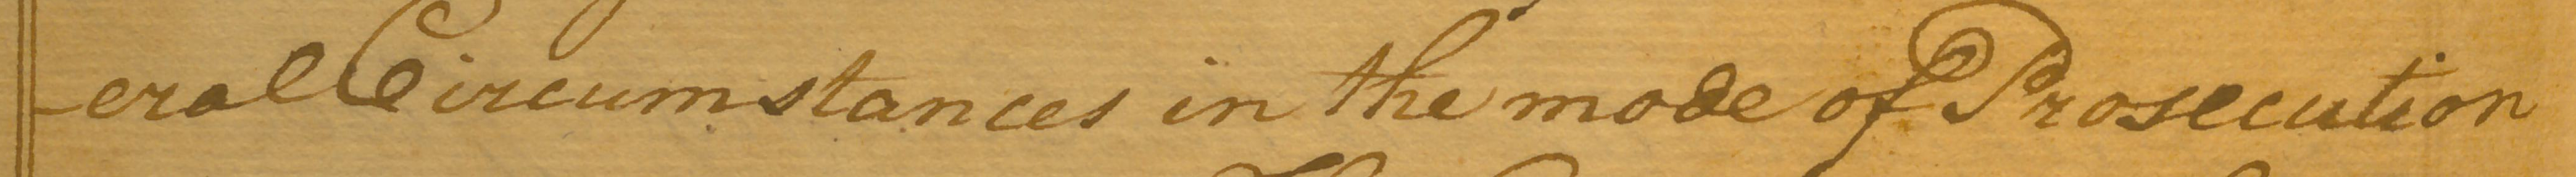-eral Circumstances in the mode of Prosecution
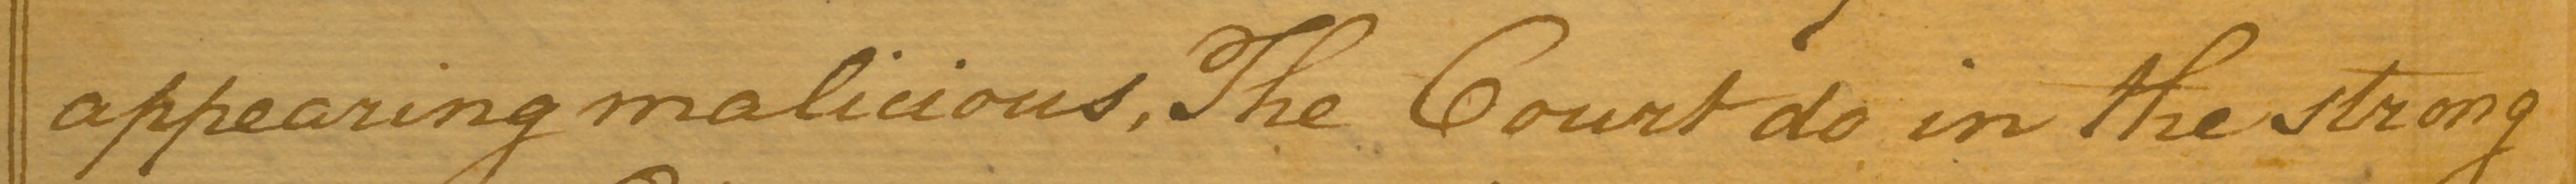appearing malicious, The Court do in the strong
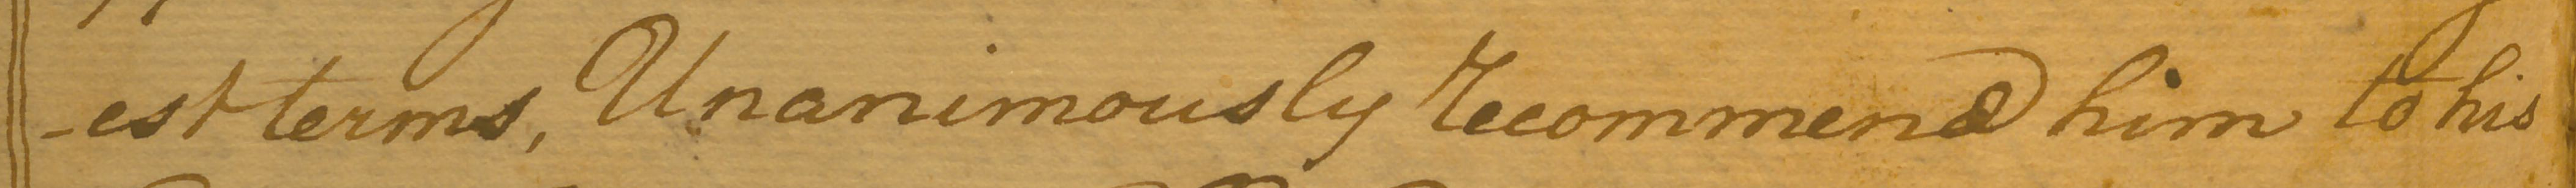-est terms, Unanimously recommend him to his
